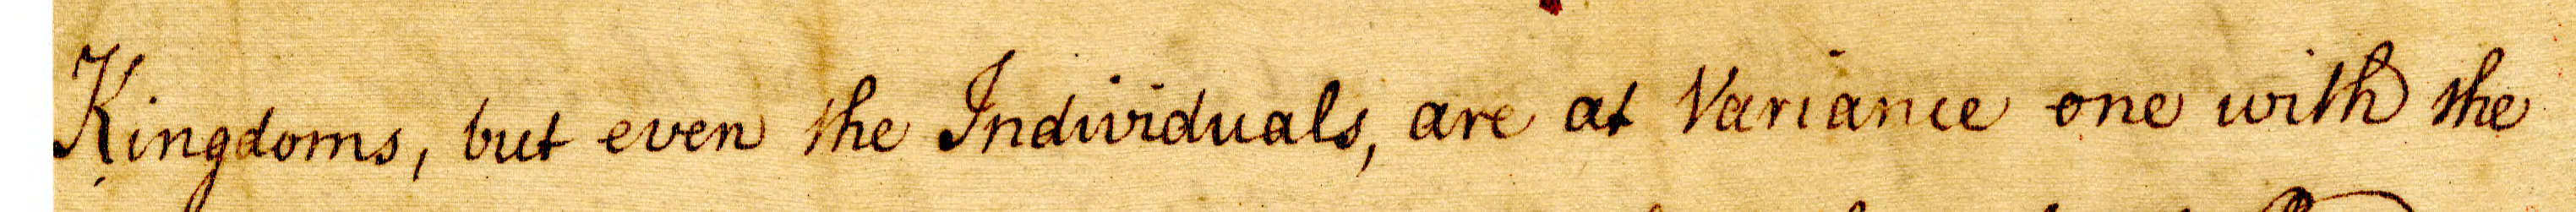Kingdoms, but even the Individuals, are at the Variance one with the
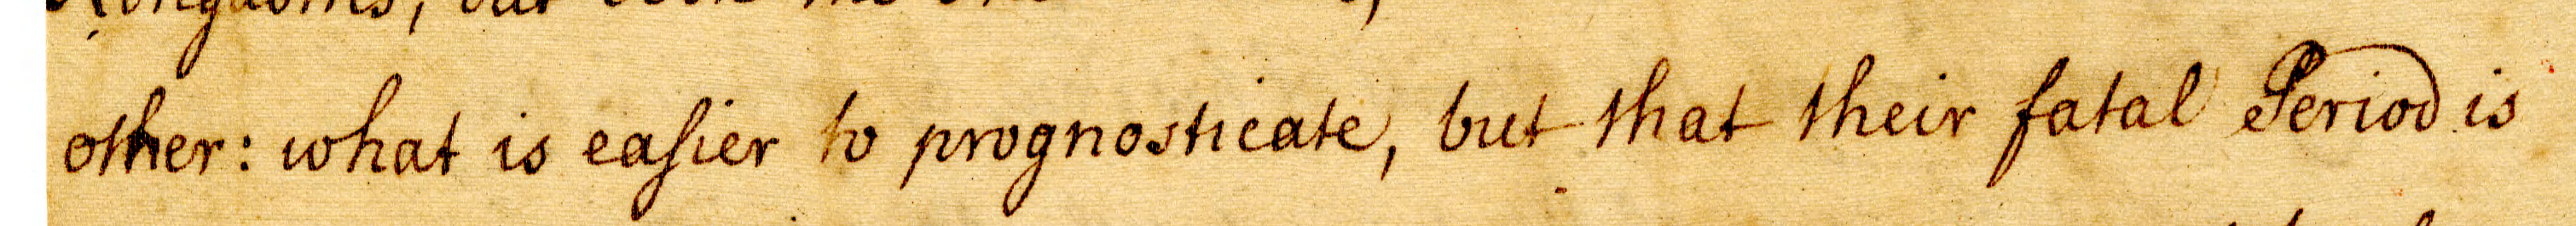other: what is easier to prognosticate, but that their fatal Period is
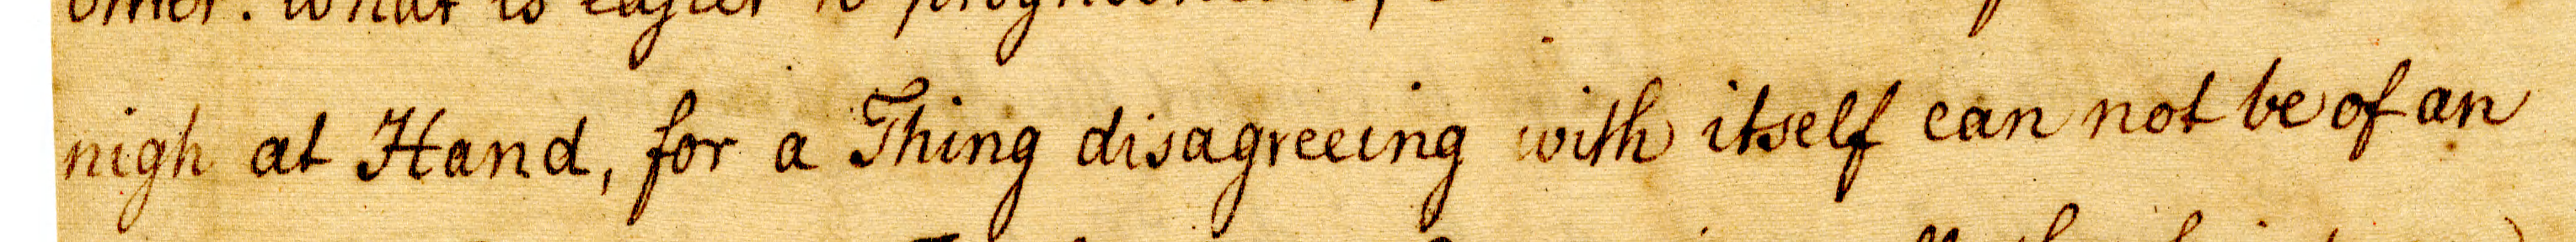nigh at Hand, for a Thing disagreeing with itself can not be of an
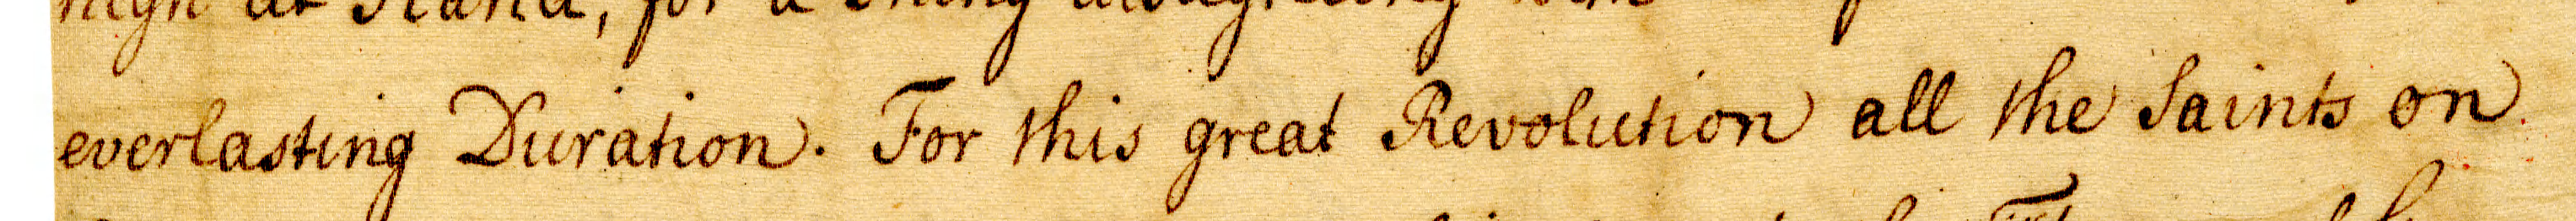everlasting Duration. For this great Revolution all the Saints on
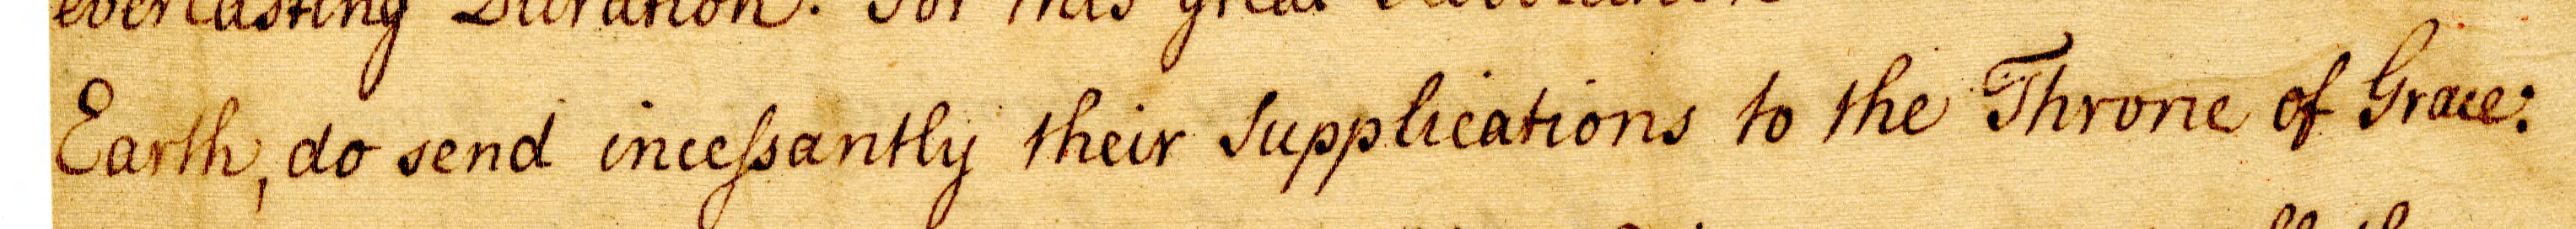Earth, do send incessantly their supplications to the Throne of Grace:
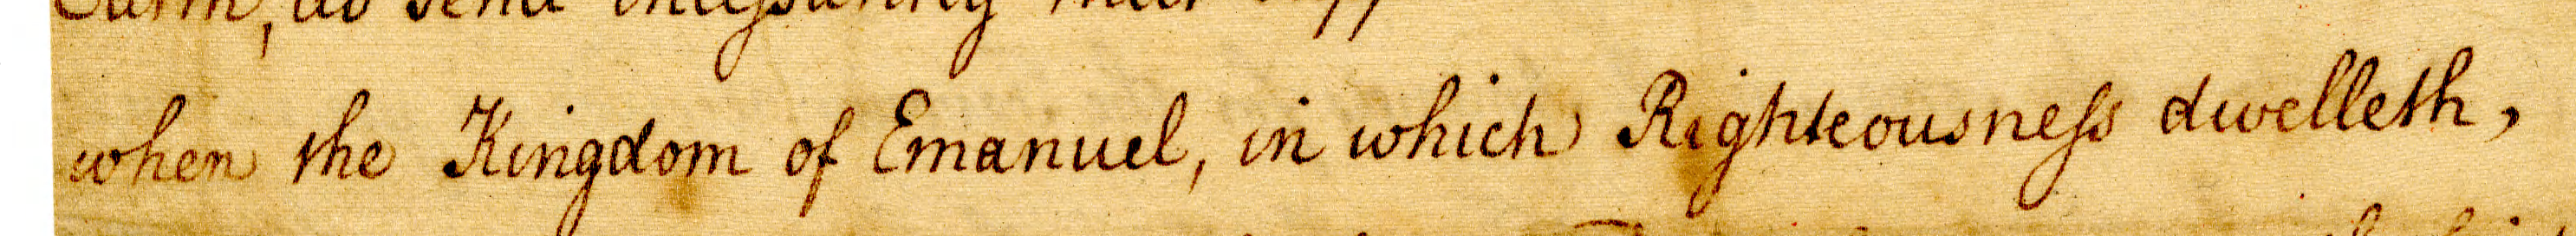when the Kingdom of Emanuel, in which Righteousness dwelleth,
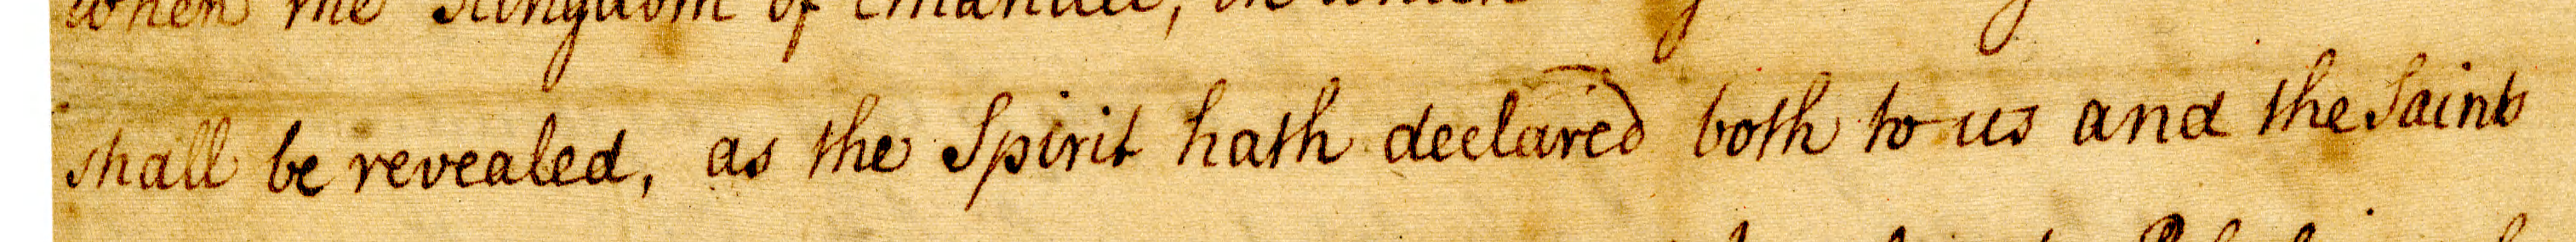shall be revealed, as the Spirit hath declared both to us and the Saints
